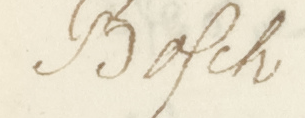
Bosch
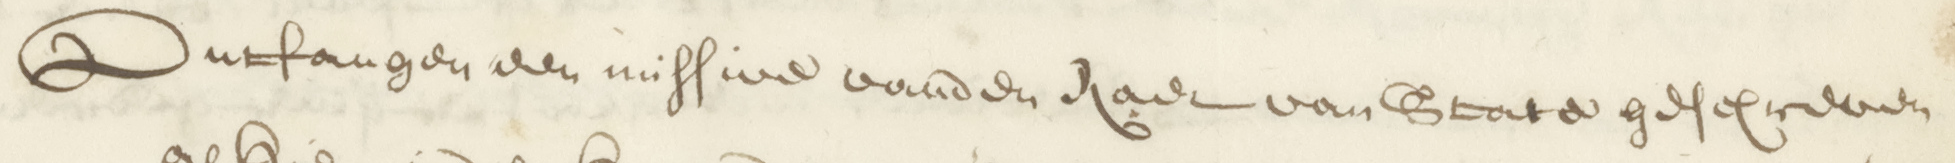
Ontfangen een missive vanden Raet van State geschreven
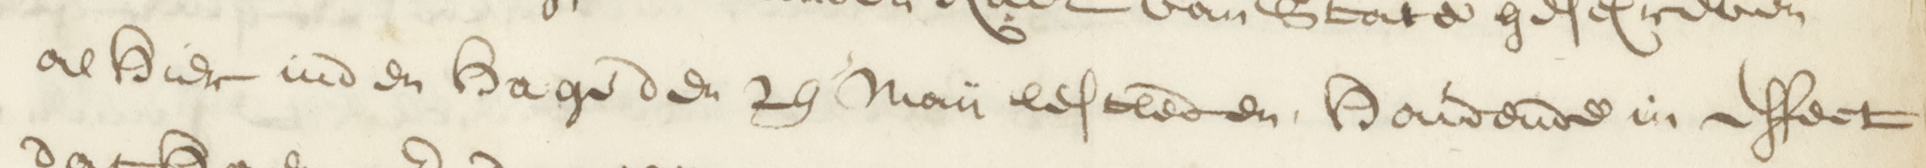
alhier inden Hage den 29 Maij lestleden, Houdende in effect
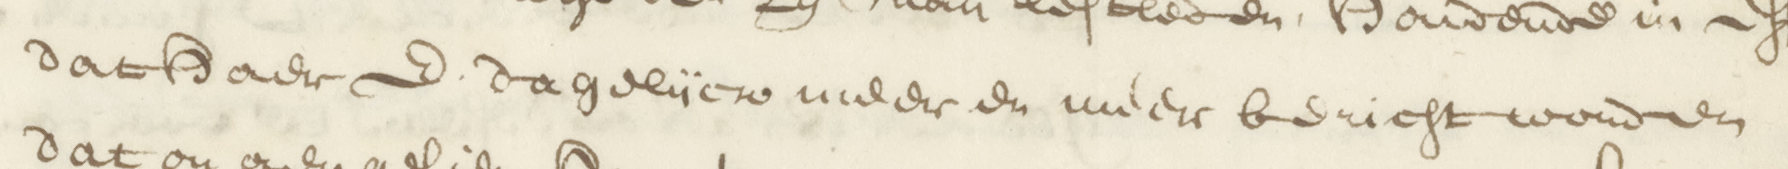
dat haer E. dagelijcx meer en meer bericht worden
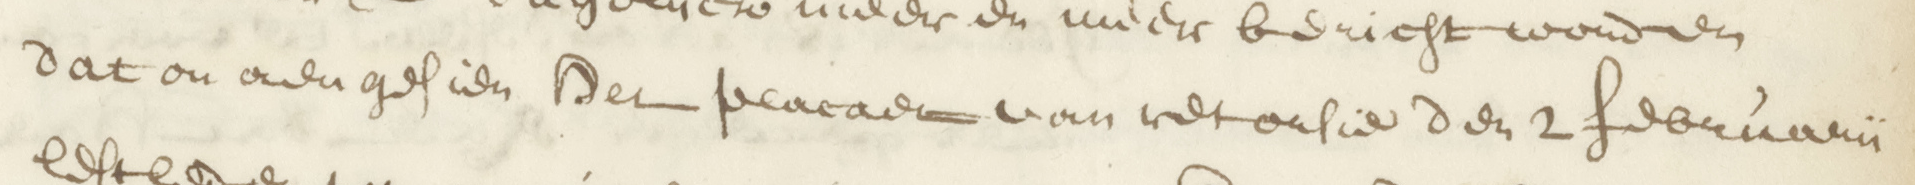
dat onaengesien het placaet van retorsie den 2 Februarij
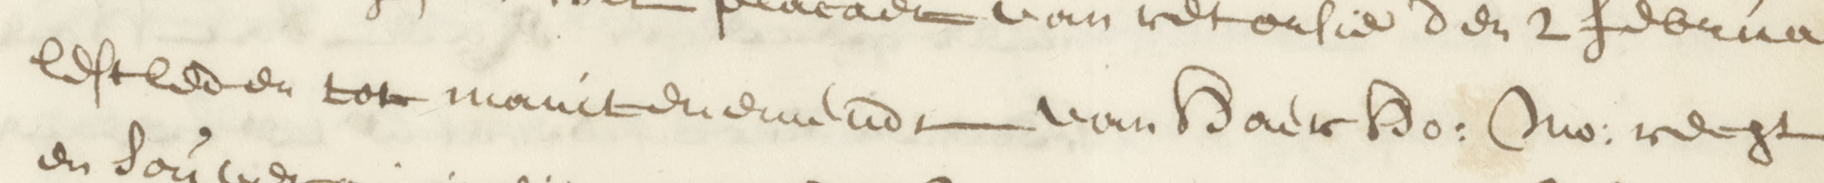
lestleden tot maintenemendt van Haer Ho:Mo: recht
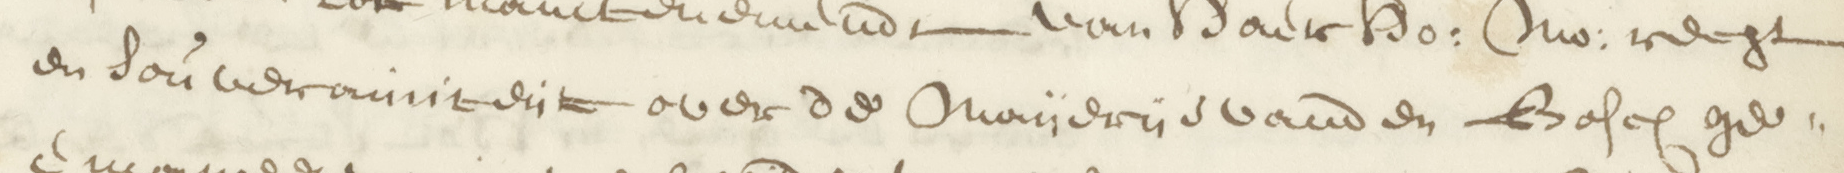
ende souverainiteijt over de Meijerije vanden Bosch ge„
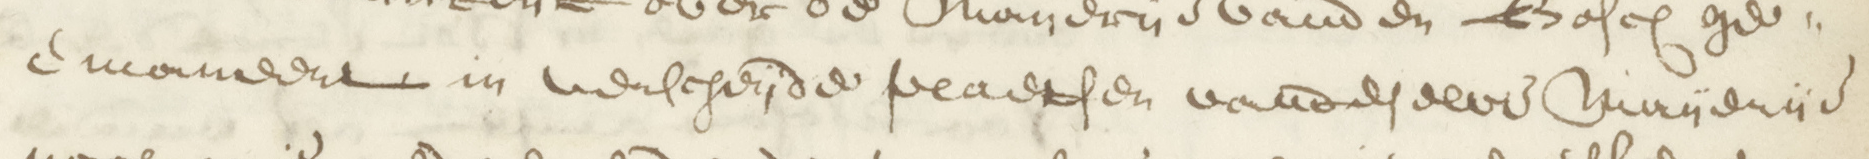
emaneert in verscheijde plaetsen vande selve Meijerije
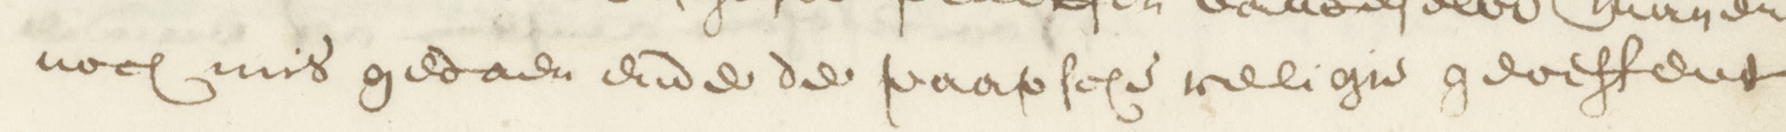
noch mis gedaen ende de paapsche religie geoeffent
